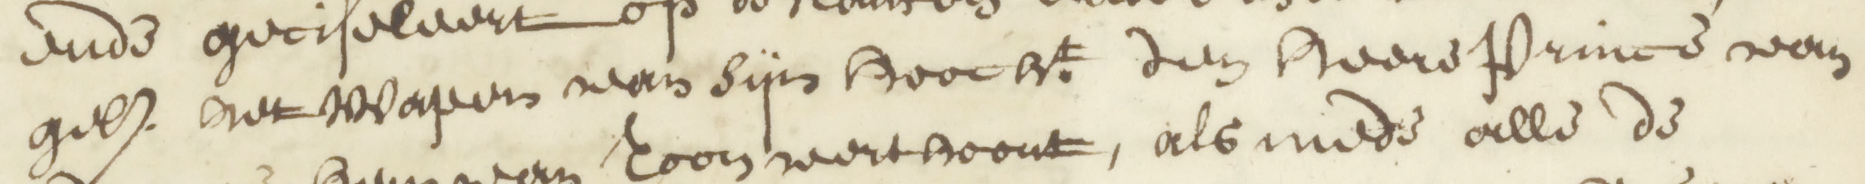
gel. het Wapen van sijn Hoocht. den Heere Prince van
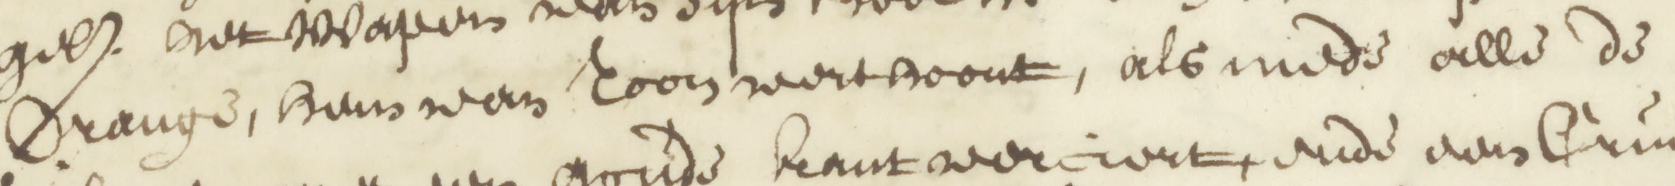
Orange, hem van roon verthoont, als mede alle de
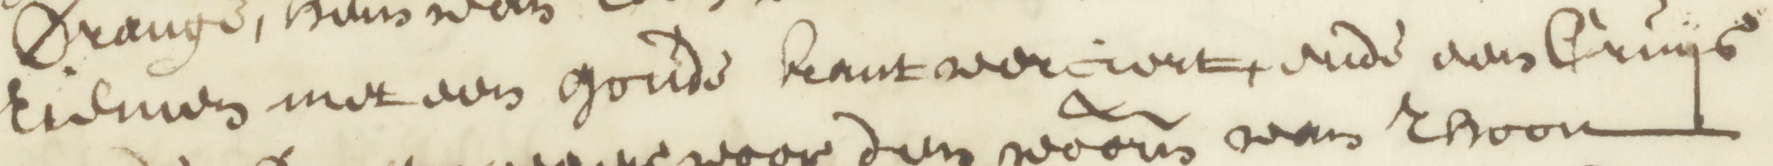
riemen met een goude kant verciert, ende een Cruijs
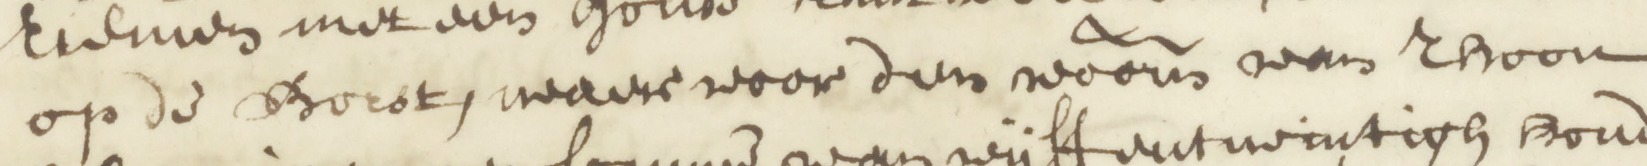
op de Borst, waer voor den voorn. van rhoon
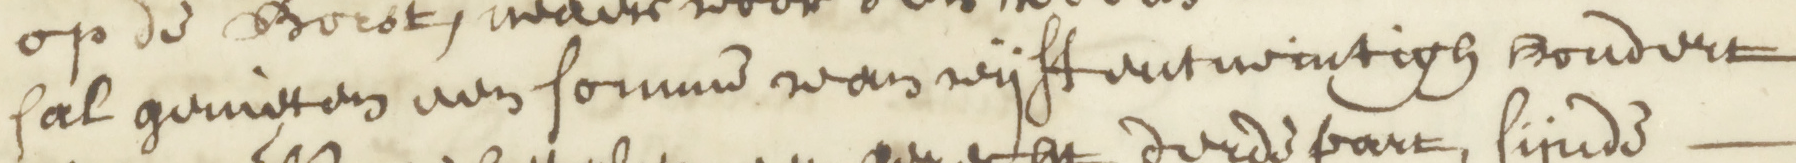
sal genieten een somme van vijffentwintigh hondert
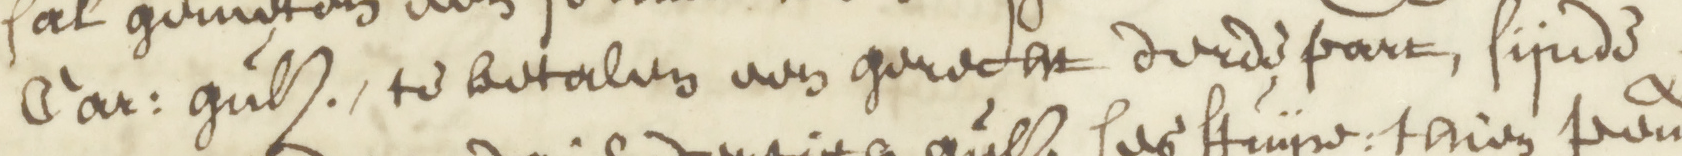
Car: gul., te betalen een gerecht derde part, sijnde
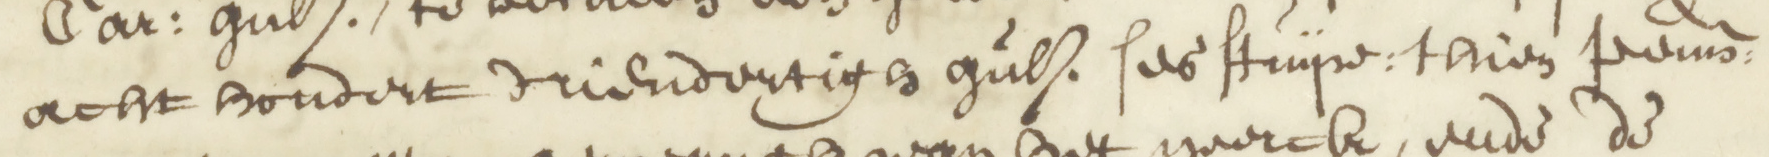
acht hondert driendertigh gul., ses stuijve: thien penn.
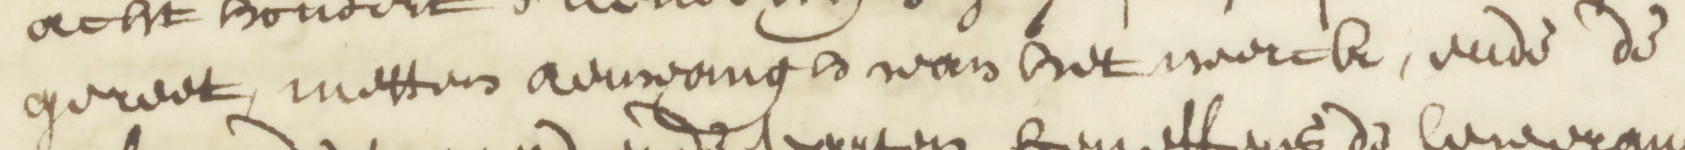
gereet, metten aenvangh van het werck, ende de
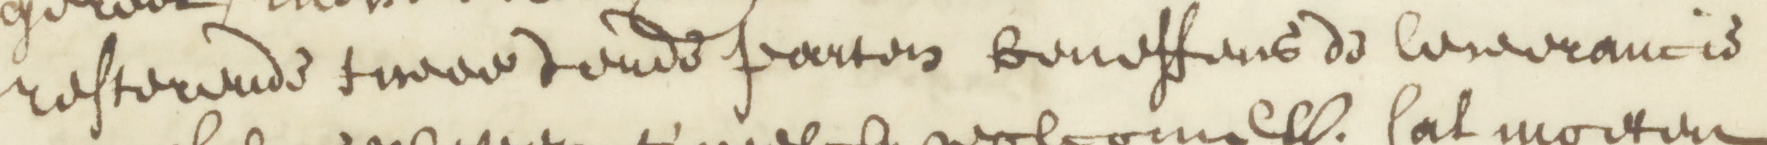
resterende twee derde parten beneffens de leverancie
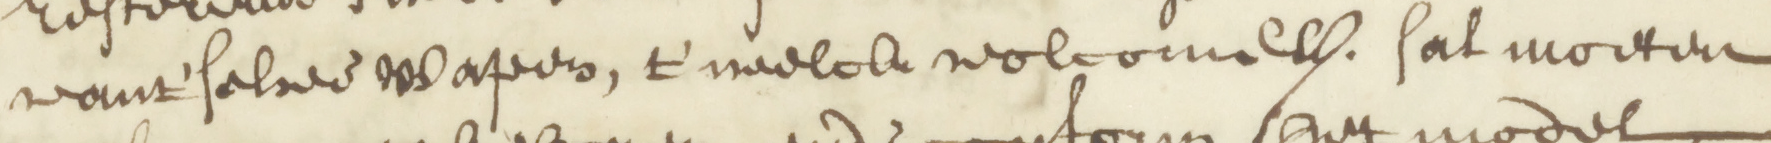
vant' selve wapen, t' welck volcomel. sal moeten
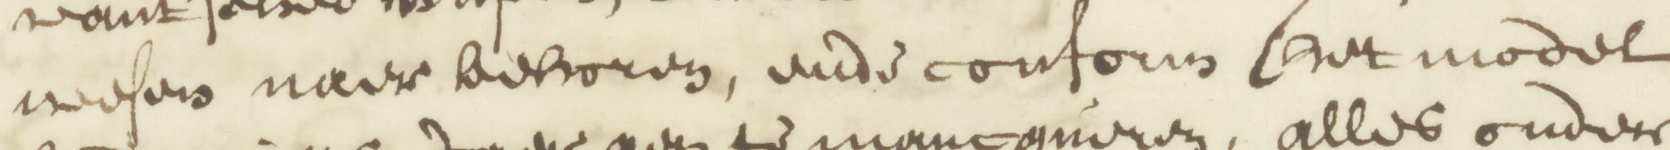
wesen naer behoren, ende conform het model
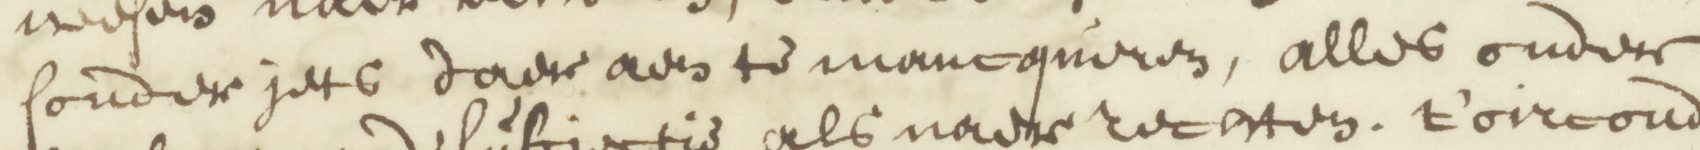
sonder iets daer aen te mancqueren, alles onder
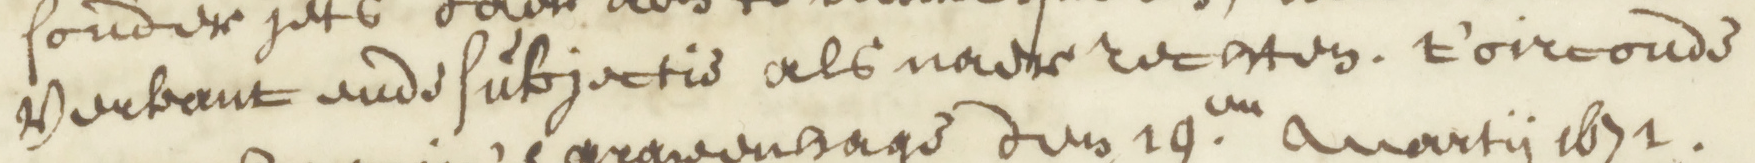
verbant ende subjectie als naer rechten.t'oirconde
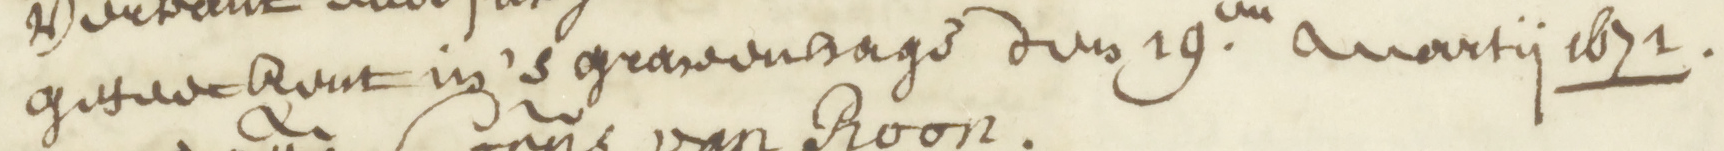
geteeckent in 's gravenhage den 19en martij 1671.
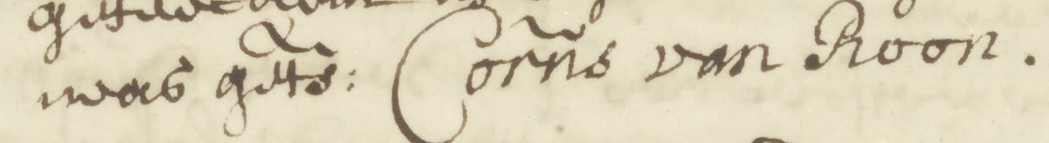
Was get.t: Corns van Roon.
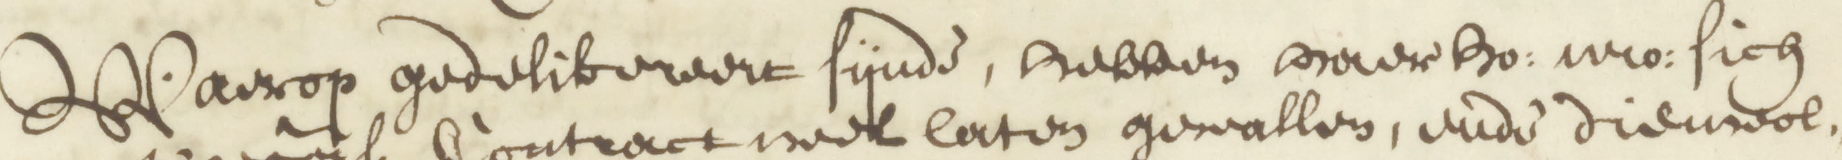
Waerop gedelibereert sijnde, hebben haer Ho:Mo: sich
